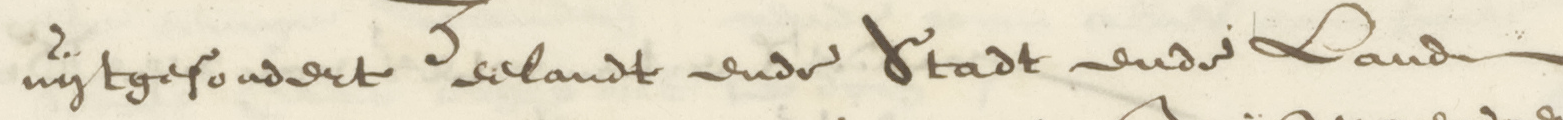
uijtgesondert Zeelandt ende Stadt ende Lande
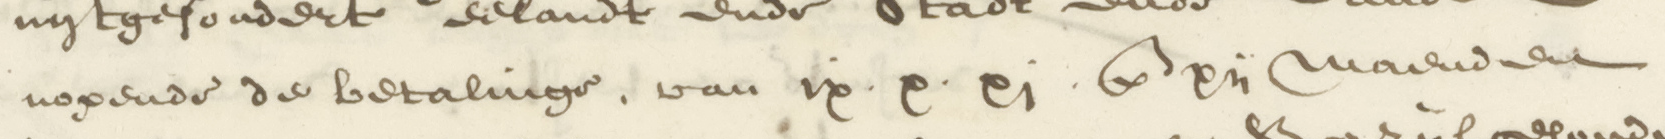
nopende de betalinge, van ix . x . xi & xii maenden
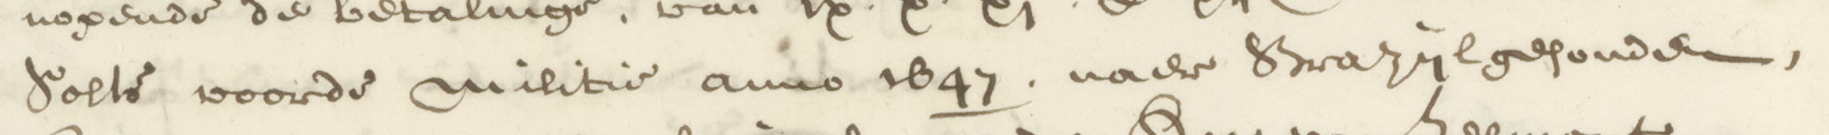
solts voorde militie anno 1647. naer Brazijl gesonden,
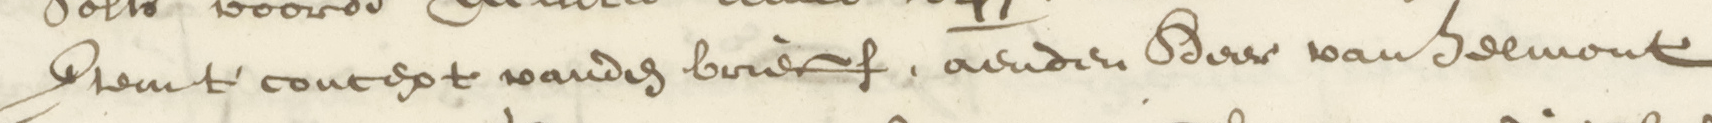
Item t' concept vanden brieff, aenden heer van Helmont
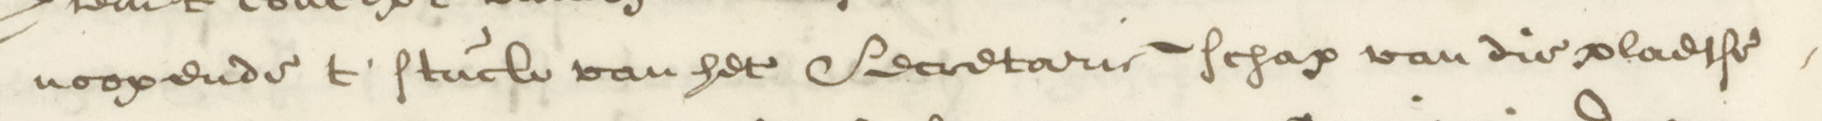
noopende t‛ stuck van het secretarisschap van die plaetse.
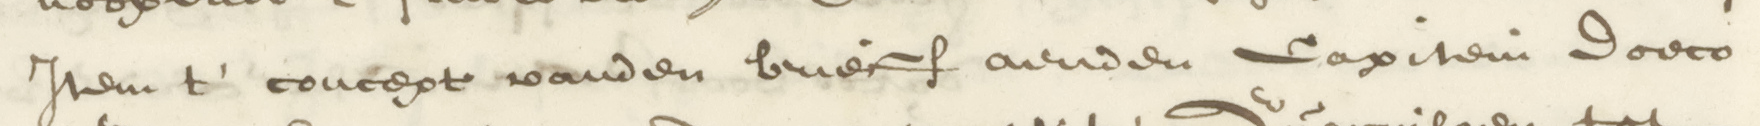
Item t‛ concept vanden brieff aenden Capiten Doeco
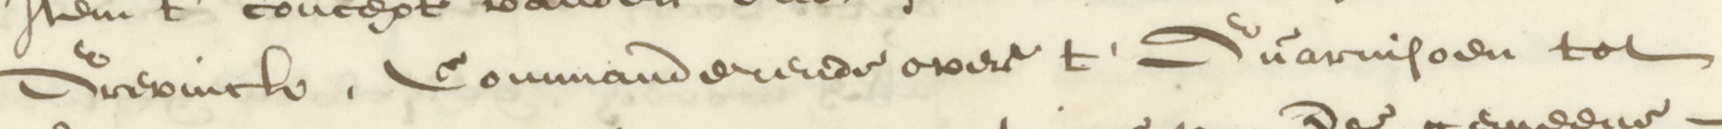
Grevinck, Commanderende over t' Guarnisoen tot
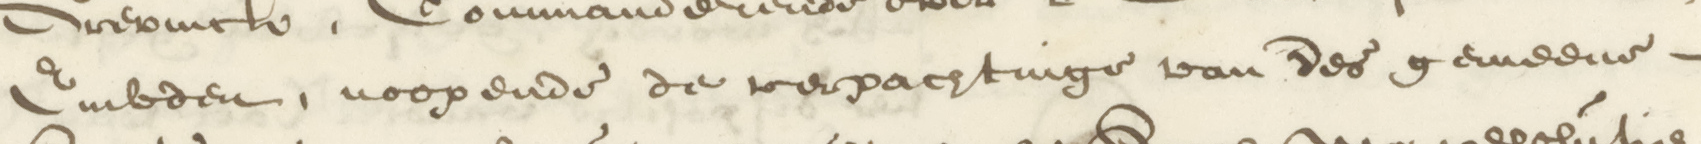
Embden, noopende de verpachtinge van des gemeene -
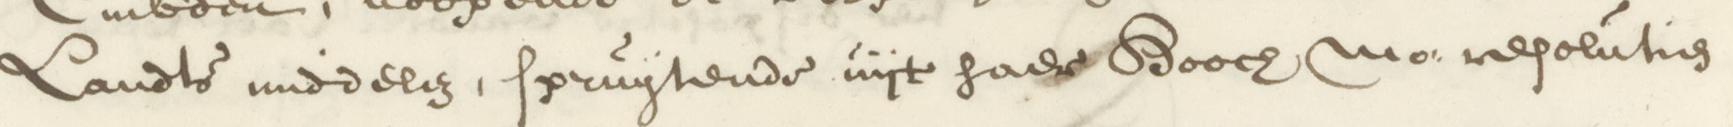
Landts middelen, spruijtende uijt haer Hooch Mo: resolutien
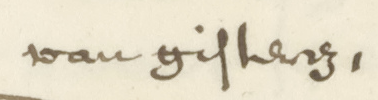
van gisteren.
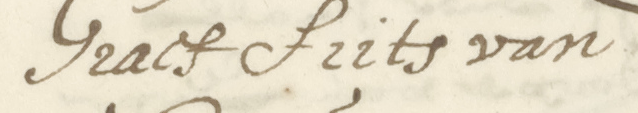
Graef Frits van
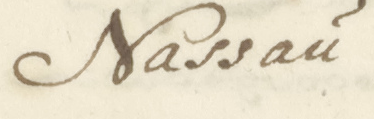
Nassau
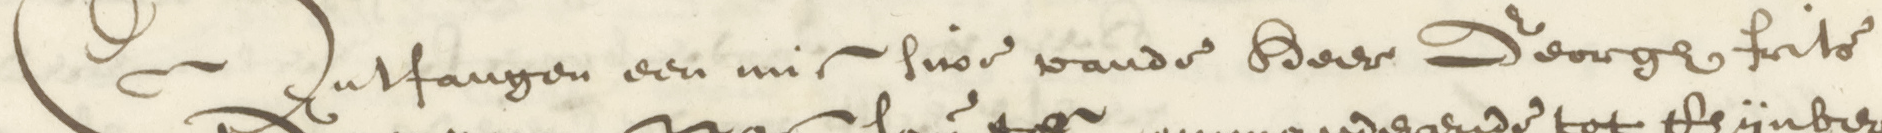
Ontfangen een missieve vande Heer Georgh frits
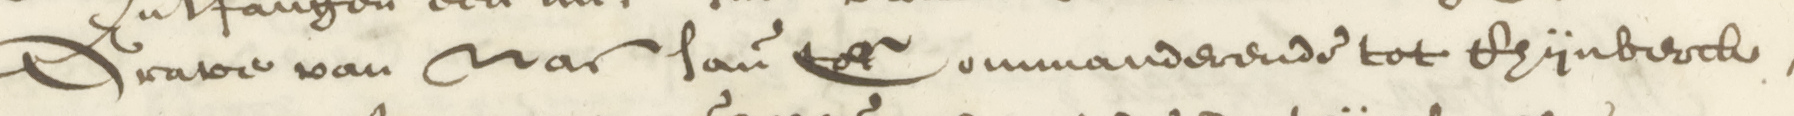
Grave van Nassau Commanderende tot Rhijnberck
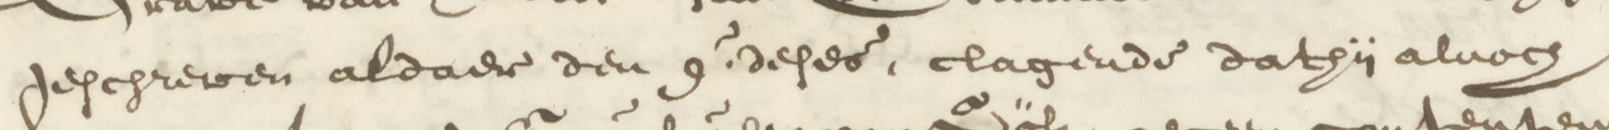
geschreven aldaer den 9e. deses, clagende dat hij alnoch
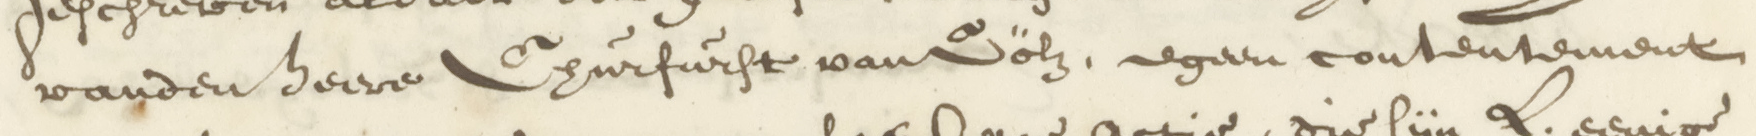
vanden heere Churfurst van Cöln, egeen contentement
